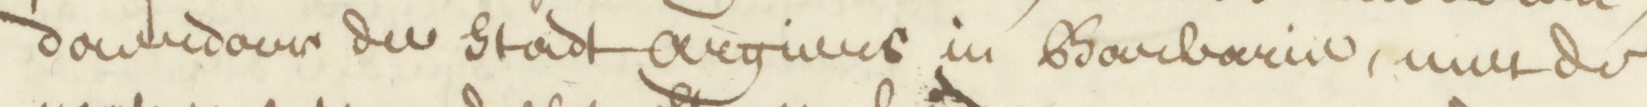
daerdoor de Stadt Argiers in Barbarie, met de
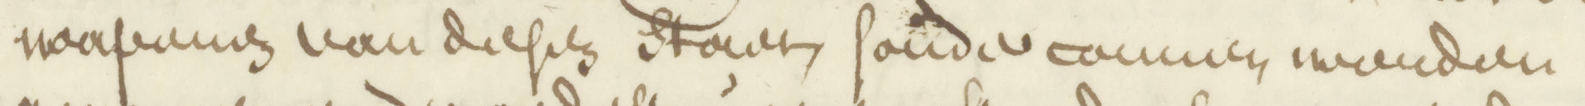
wapenen van desen Staet, soude connen werden
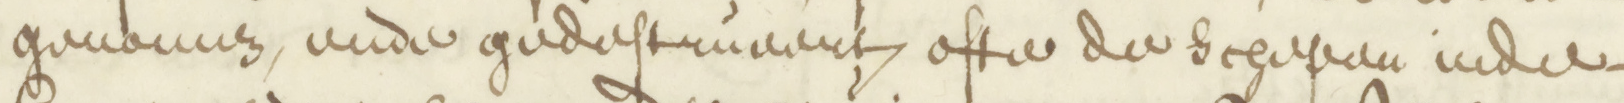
genomen, ende gedestrueert, ofte de schepen inde
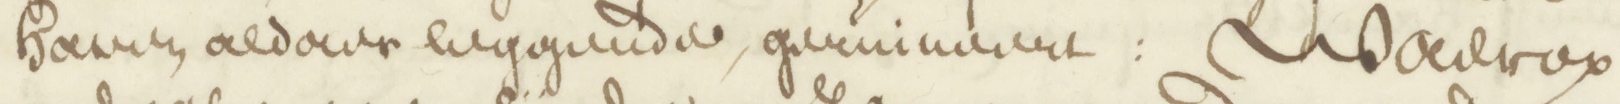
haven aldaer leggende, geruineert: Waerop
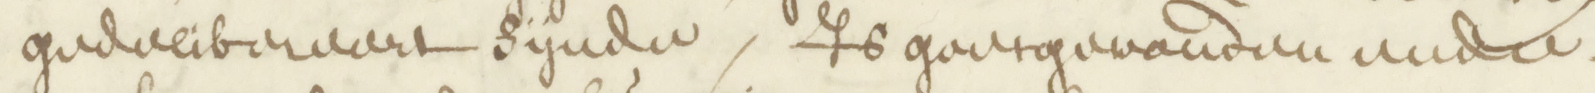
gedelibereert sijnde, Is goetgevonden ende
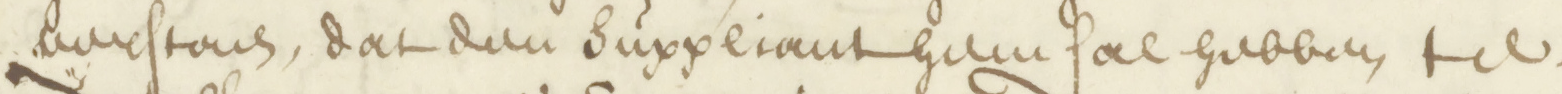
verstaen, dat den Suppliant hem sal hebben te
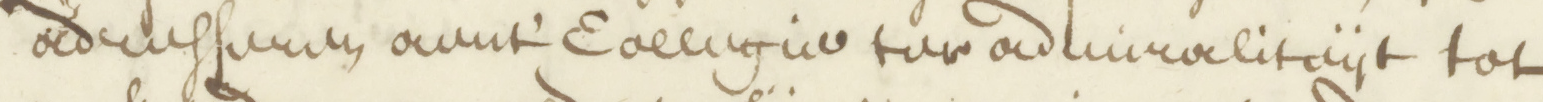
adresseren aent' Collegie ter admiraliteijt tot
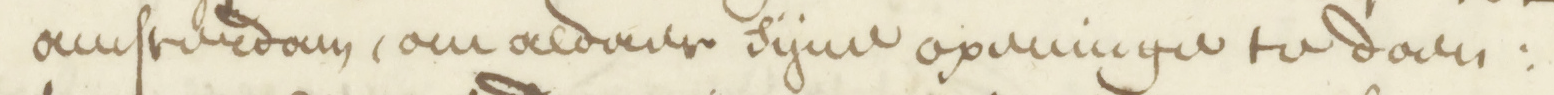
amsterdam, om aldaer sijne openinge te doen:
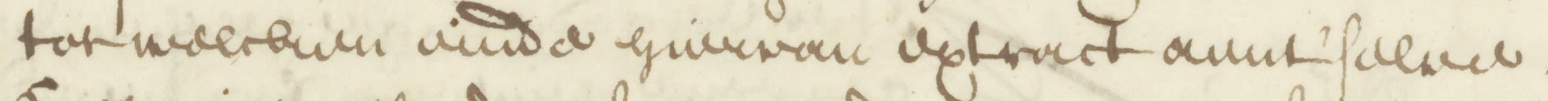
tot welcken einde hiervan extract aent' selve
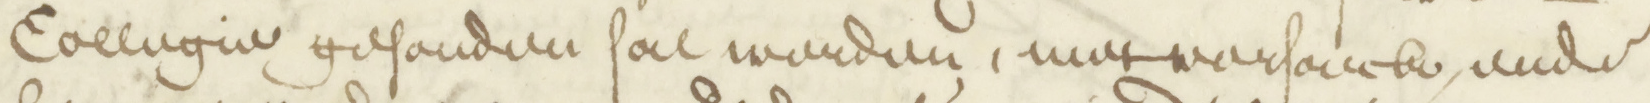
Collegie gesonden sal werden, met versoeck, ende
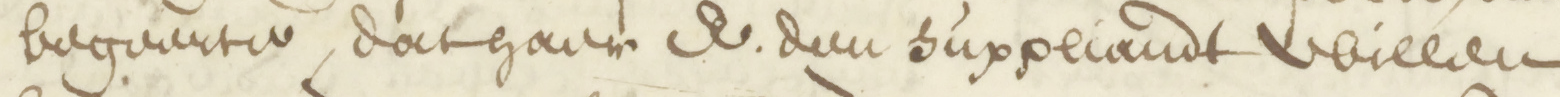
begeerte, dat haer E. den Suppliandt willen
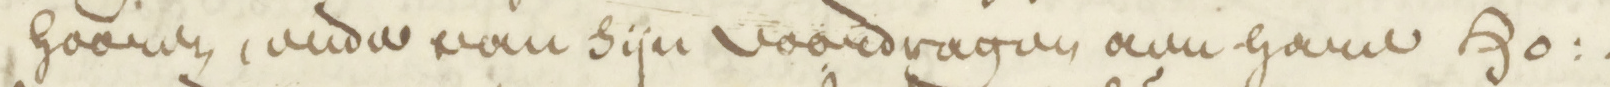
hooren, ende van sijn voordragen aen hare Ho:
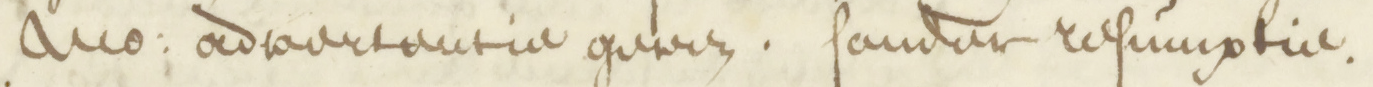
Mo: advertentie geven. sonder resumptie.
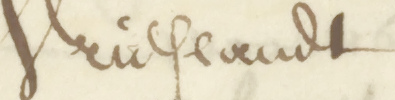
Vrieslandt
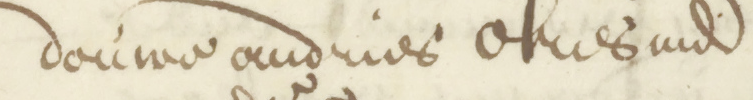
douwe andries Okes inde
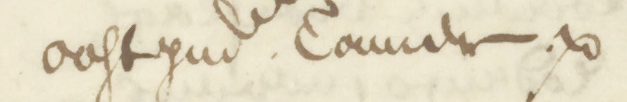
oostInd Camer @
